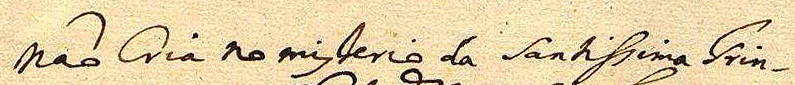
naõ Cria no misterio da Santissima Trin
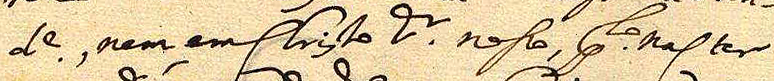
de., nem em Christo sor. nosso, p.lo naꝭ ter
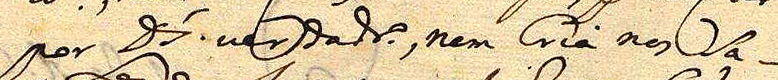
por Ds̄ uerdadr.o, nem Cria nos sa
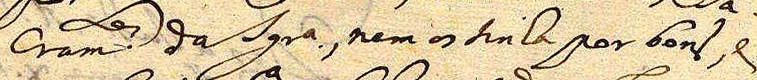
cram.tos da Igra., nem os tinha por bons, e
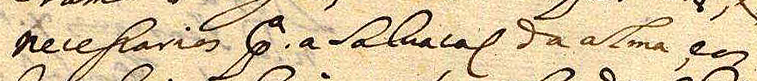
necessarios p.a a saluaçaꝭ da alma, e os
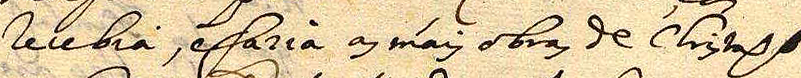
Recebia, e fazia as mais obras de Christaꝭ
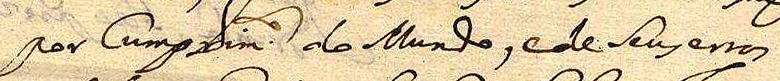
por Cumprim.to do Mundo, e de seus erros
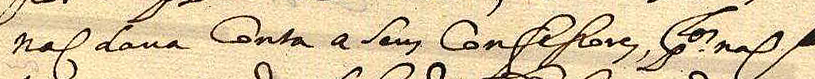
naꝭ daua Conta a seus Confessores, p.los naꝭ
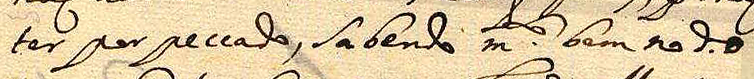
ter por peccado, sabendo m.to bem no d.o
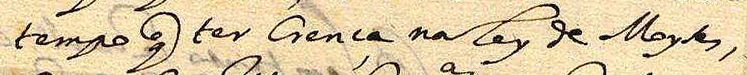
tempo q̄ ter crença na ley de Moyses,
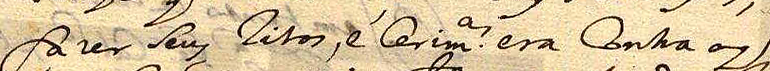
fazer seus Ritos, e Cerim.as era Contra o q̄
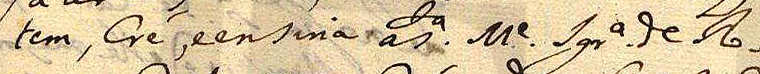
tem, Cre e ensina a s.ta Me. Igra de Ro
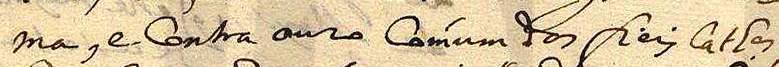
ma, e Contra o uzo Com̄um dos fieis Cath.os,
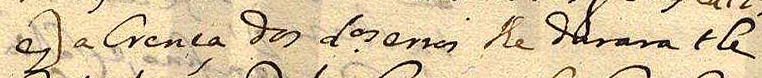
e q̄ a Crença dos d.os erros lhe durara the
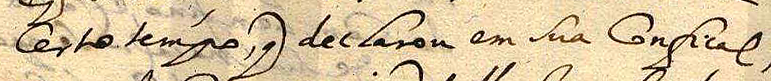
Certo tempo, q̄ declarou em sua Confiçaꝭ,
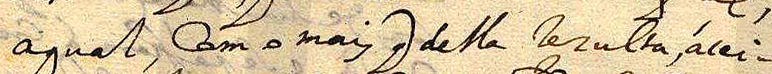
a qual, Com o mais q̄ della Rezulta, acei
